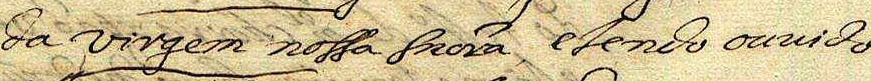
da virgem nossa snorā, e tendo ouuido
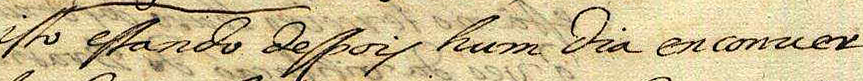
isto estando despois hum dia en comuer
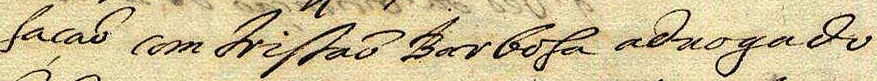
saçaõ com Tristaõ Barbosa aduogado
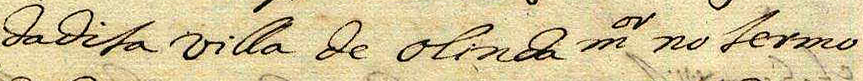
da dita villa de Olinda mor no termo
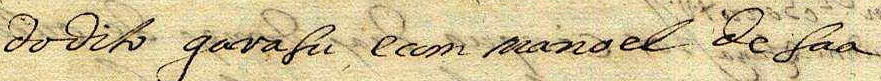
do dito garasu, e com Manoel de saa
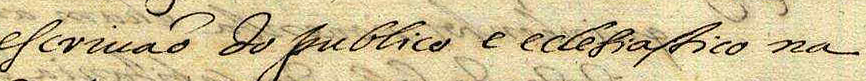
escriuaõ do publico e eclesiastico na
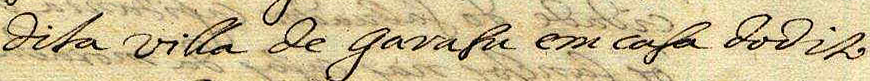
dita villa de garasu em casa do dito
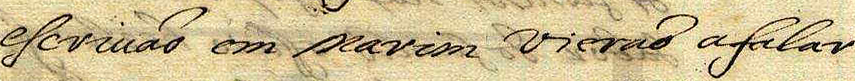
escriuaõ em Marim vieraõ a falar
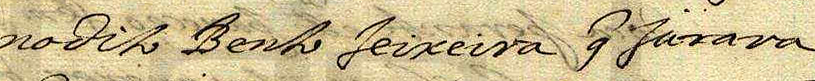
no dito Bento Teixeira que Jurara
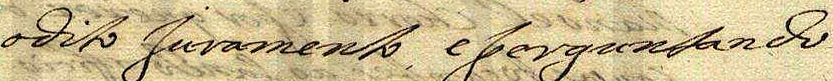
o dito Juramento, e perguntando
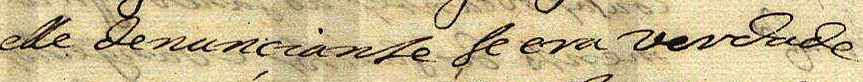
elle denunçiante se era verdade
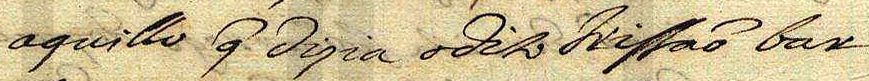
aquillo q̄ dizia o dito Tristaõ bar
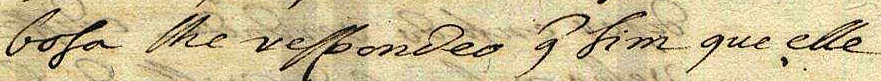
bosa lhe respondeo q̄ sim que elle
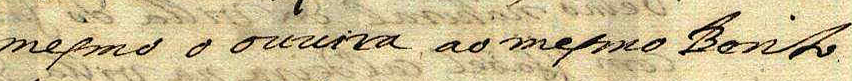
mesmo o ouuira ao mesmo Bento
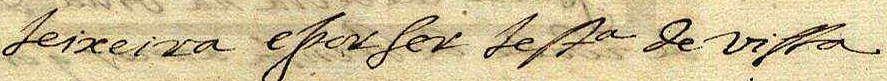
teixeira e por ser testa de vista
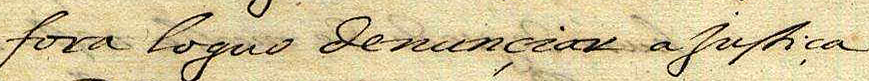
fora loguo denunciar a Justiça
